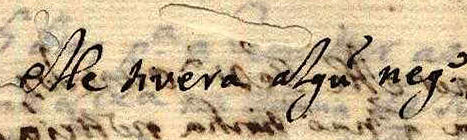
elle tivera algū neg.o
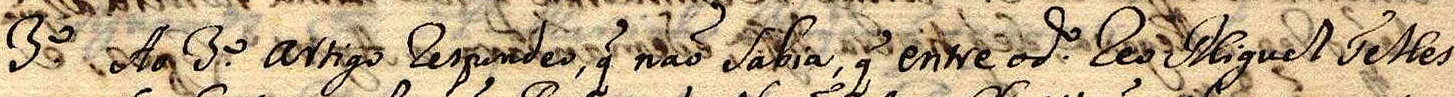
3.o Ao 3.o artigo Respondeo, q̄ nao sabia, q̄ entre o d.o Reo Miguel Telles
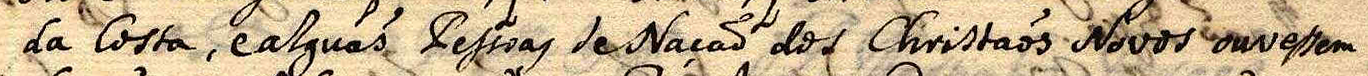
da Costa, e alguas̄ Pessoas de Naçaõ dos Christaõs Novos ouvessem
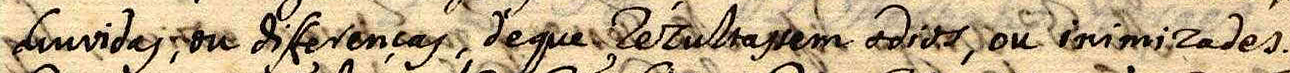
duuvidas, ou differenças, de que Rezultassem odios, ou inimizades.
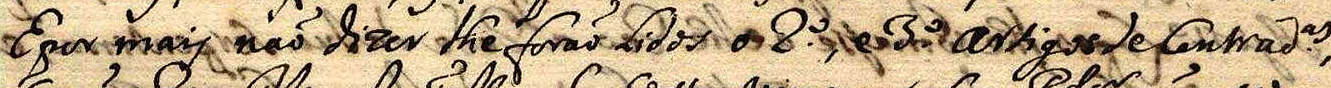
E por mais naõ dizer lhe foraõ lidos o 2.o, e 3.o artigos de Contrad.as,
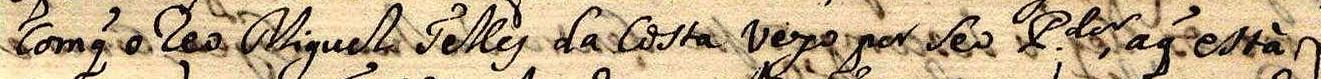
com q̄ o Reo Miguel Telles da Costa veyo por seo P.dor, a q̄ está
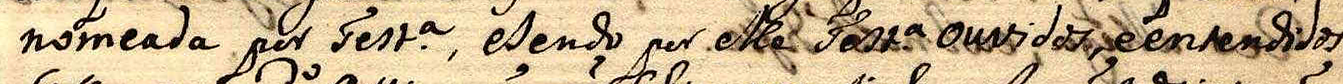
nomeada por Test.a, e sendo por elle Test.a ouvidos, e entendidos
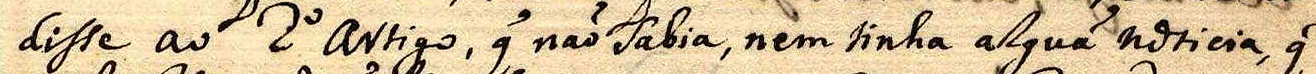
disse ao 2o artigo, q̄ naõ sabia, nem tinha alguā noticia, q̄
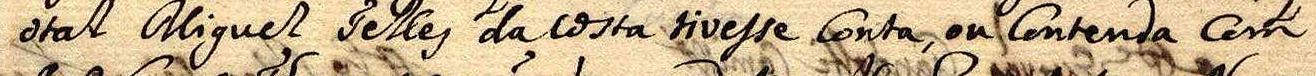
o tal Miguel Telles da costa tivesse Conta, ou Contenda com
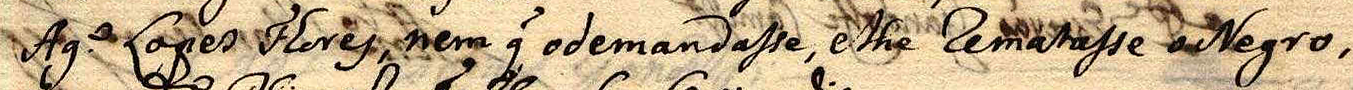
Ag.o Lopes Flores, nem q̄ o demandasse, e lhe Rematasse o Negro,
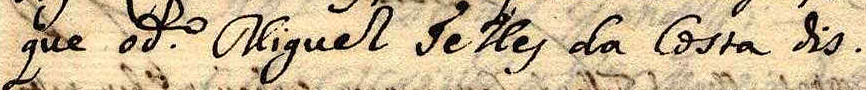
que o d.o Miguel Telles da Costa dis.
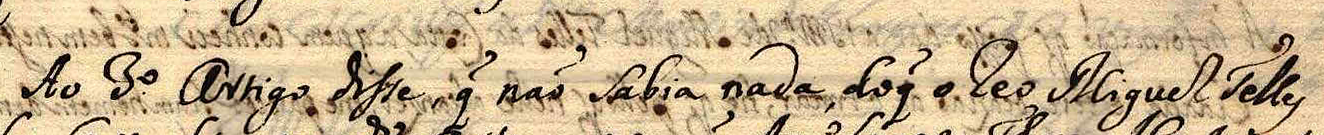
Ao 3.o Artigo disse, q̄ naõ sabia nada, do q̄ o Reo Miguel Telles
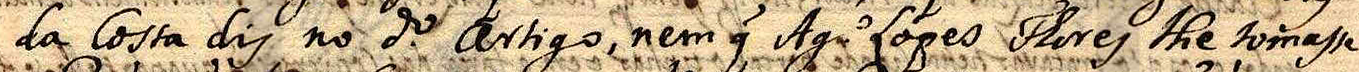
da Costa dis no d.o artigo, nem q̄ Ag.o Lopes Flores lhe tomasse
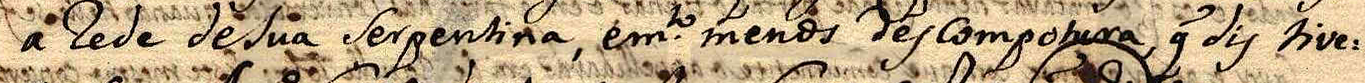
a Rede de sua serpentina, e m.to menos descompotura, q̄ dis tive
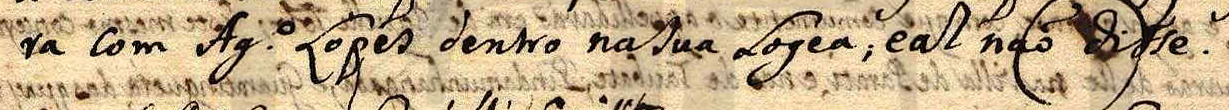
ra com Ag.o Lopes dentro na sua Logea; e al naõ disse.
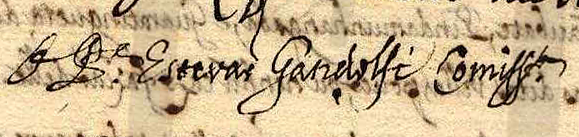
O P.e Estevaõ Gandolfi Comiss.o
